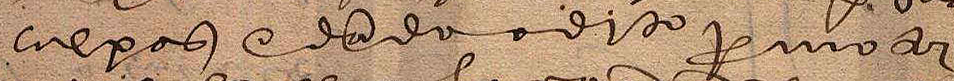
culpas e dādo o djto ꝓmotor
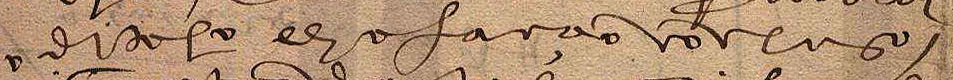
o dito Lo lho façaõ cōcluso /
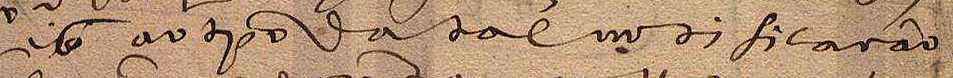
e q̄ ao tpō da tal notificação
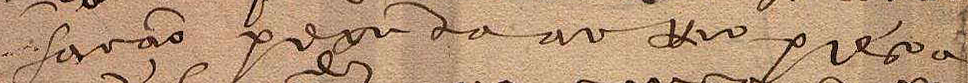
fação pregūta ao Reo preso a
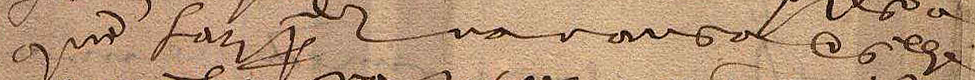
quē faz ꝓdor na causa e se lhe
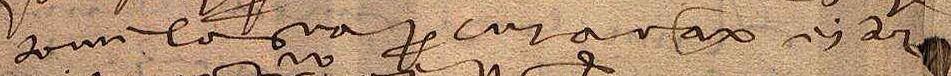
tome ha sua ꝓcuracaõ ejtor
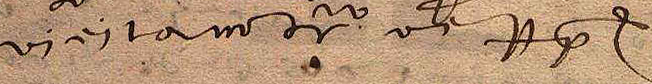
vjejra notrro o estp̄j
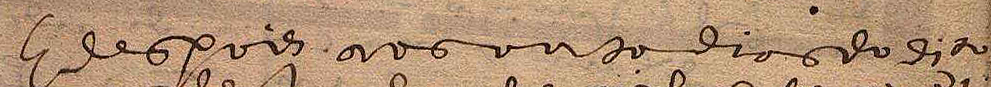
E despois aos outo dias do dito
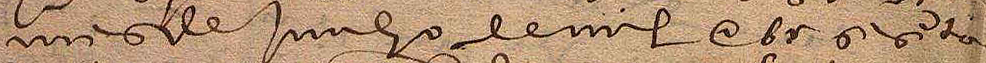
mes de Junho de miL e bc sesēta
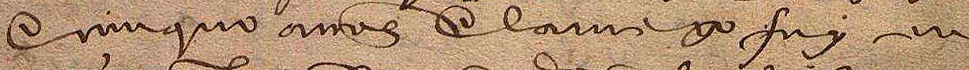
e çinquo anōs ē lamego fuy eu
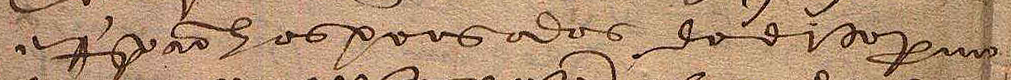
estp̄vaõ has pousadas do dito ꝓomo
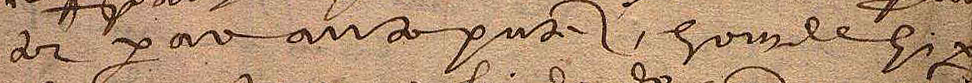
tor ꝑa o auto pret̄e homde hi ꝑ
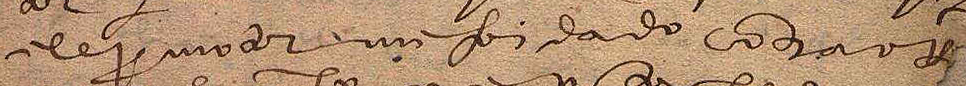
ele ꝓmotor me foi dado cōtra o R
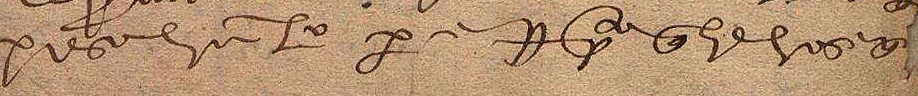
preso hū Lo ꝑ estp̄to q̄ he ho seḡ
